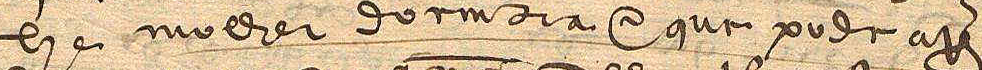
he molher doemtia e que pode aꝟ
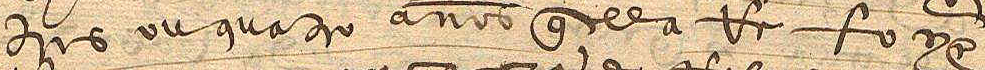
tres ou quatro an̄os q̄ ella Re foy ē
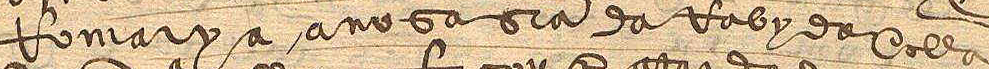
Romarya a nosa srā daRabyda e ella
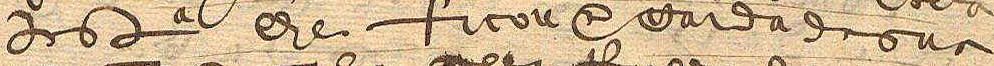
testa lhe ficou ē garda de sua
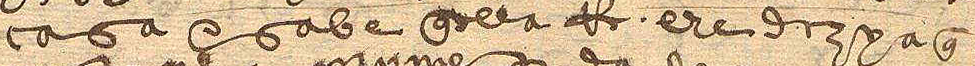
casa e sabe q̄ ella Re . lhe dezya q̄
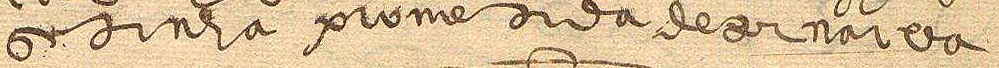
se tinha prometida de tornar lla
